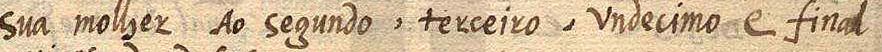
Sua molher Ao Segundo, terceiro, Vndecimo e final
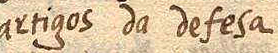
artigos da defesa
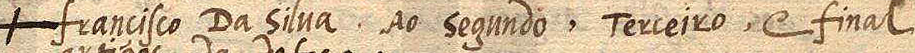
francisco Da Silva, Ao Segundo, Terceiro, e final
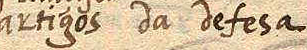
artigos da defesa
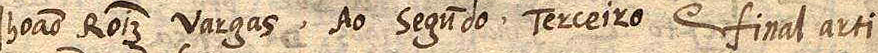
Jhoão Ro̅iz Vargas, Ao Segu̅do, Terceiro e final arti
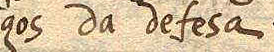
gos da defesa
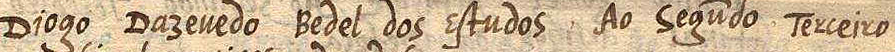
Diogo Dazeuedo Bedel dos Estudos, Ao Segu̅do Terceiro
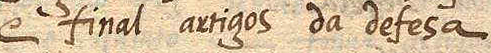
e final artigos da defesa
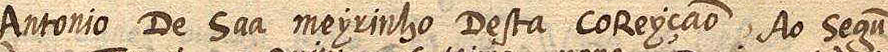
Antonio De Saa meyrinho Desta CoReyção, Ao Segu̅
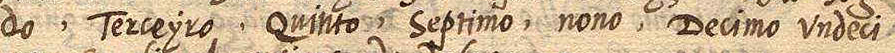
do, Terceyro, Quinto, Septimo, nono, Decimo Vndeci
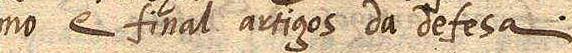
mo e final artigos da defesa.
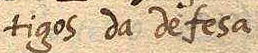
tigos da defesa
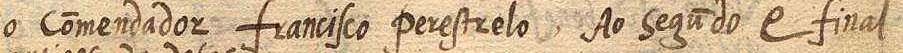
O Co̅mendador francisco Perestrelo, Ao Segu̅do e final
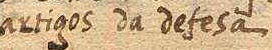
artigos da defesa
